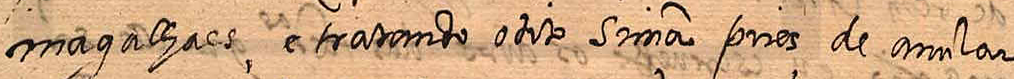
magalhaes, e tratando o dito Simão pires de anular
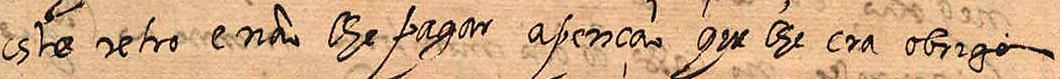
este retro e não lhe pagar a penção que lhe era obriga
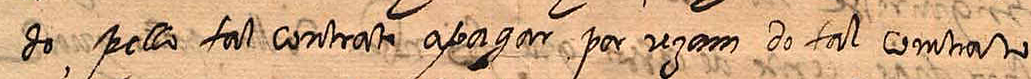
do, pello tal contrato a pagar por rezam do tal comtrato
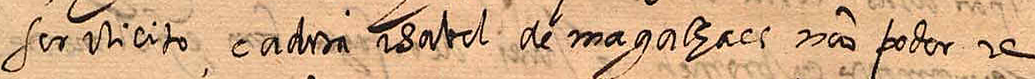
ser ilicito, e a dita isabel de magalhaes não poder re
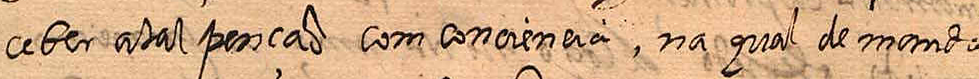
ceber a tal penção com conciencia, na qual demanda
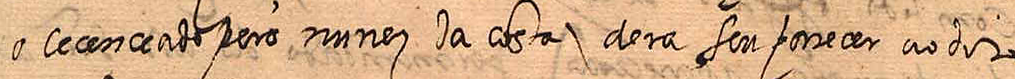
o lecenceado pero nunez da costa dera seu parecer ao dito
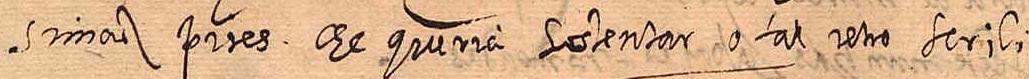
Simão pires. lhe queria sostentar o tal retro ser ili
